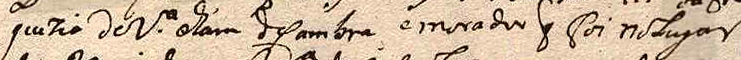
guezia de V.a cham de Cambra, e morador q̄ foi no Lugar
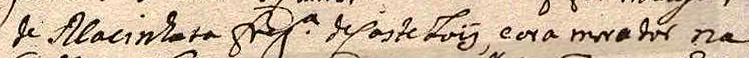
de Macinhata freg.a de CasteLois, e ora morador na
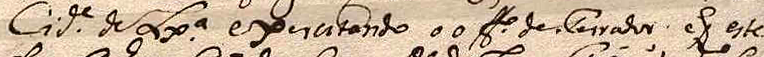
Cid.e de Lx.a exercitando o off.o de Ferrador; e q̄ este
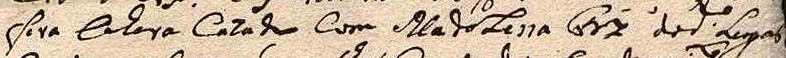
fora E hera Cazado com MadoLena Frz̄ do d.o Lugar
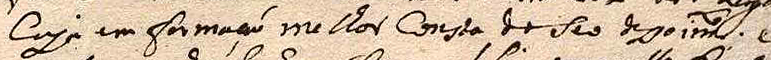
Cuja emformaçaõ melhor Consta do seo depoim.to. e
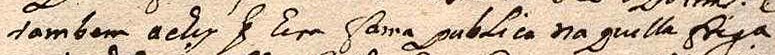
tambem achey q̄ hera fama pubLica naquella freg.a
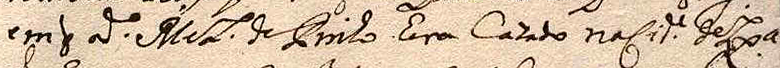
em q̄ o d.o MeL. de Pinho hera Cazado na Cid.e de Lx.a
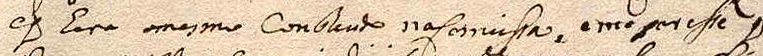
e q̄ hera o mesmo Contheudo na Comissā, e me paresse q̄
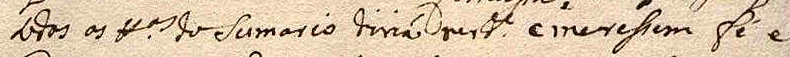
todas as tt.as do Sumario diriā verd.e e meressem fé e
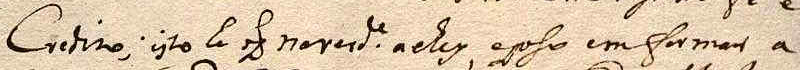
Credito, isto he o q̄ na verd.e achey, e poso emformar a
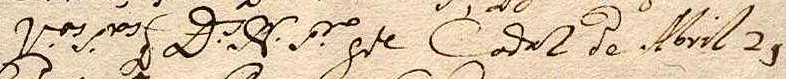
V.as S.ras q̄ D.s N. S.ro gde CodaL 2 de Abril 29
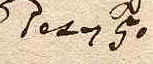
de 1750
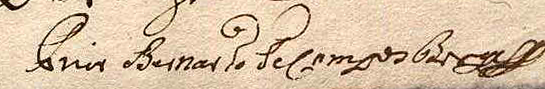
Prior Bernardo de Campos Borges
